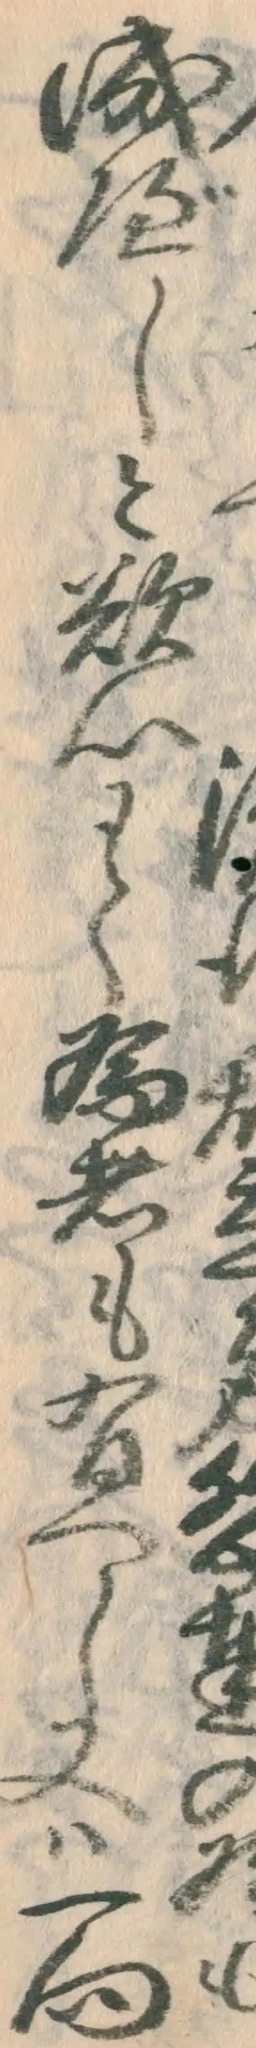成べしと欲心にて為者も有へし又ハ一向

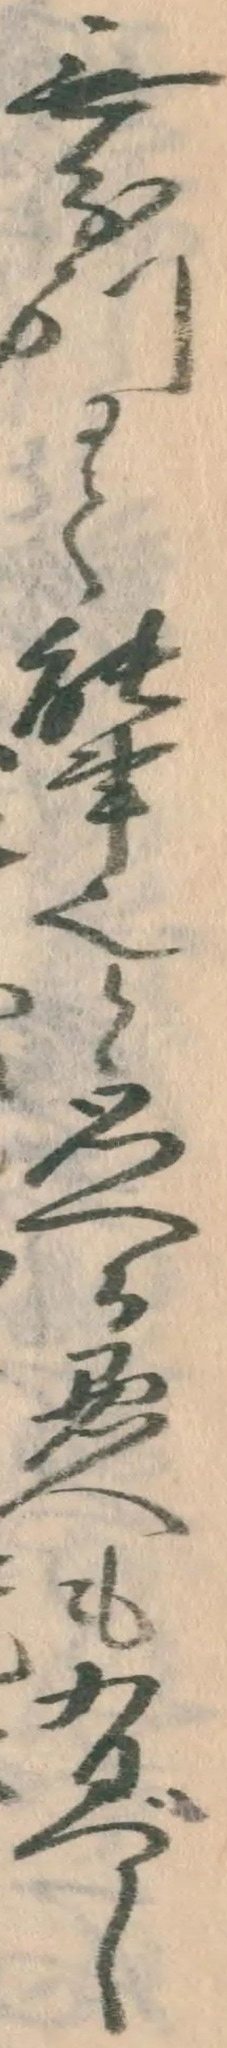無分別にて能事也と思へる愚人も有べし
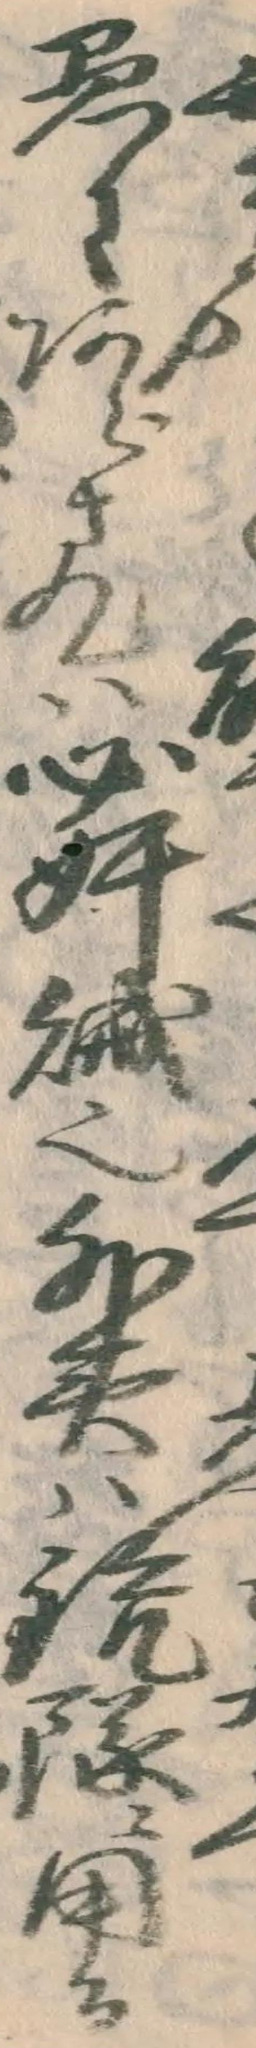愚にあらされハ必奸賊也外夷ハ銃隊ニ用る
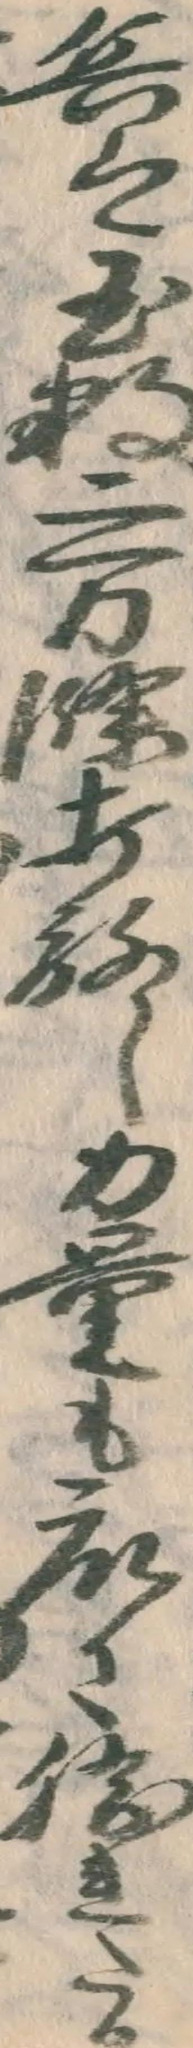兵は玉数二万餘打放し力量も衆に勝れたる
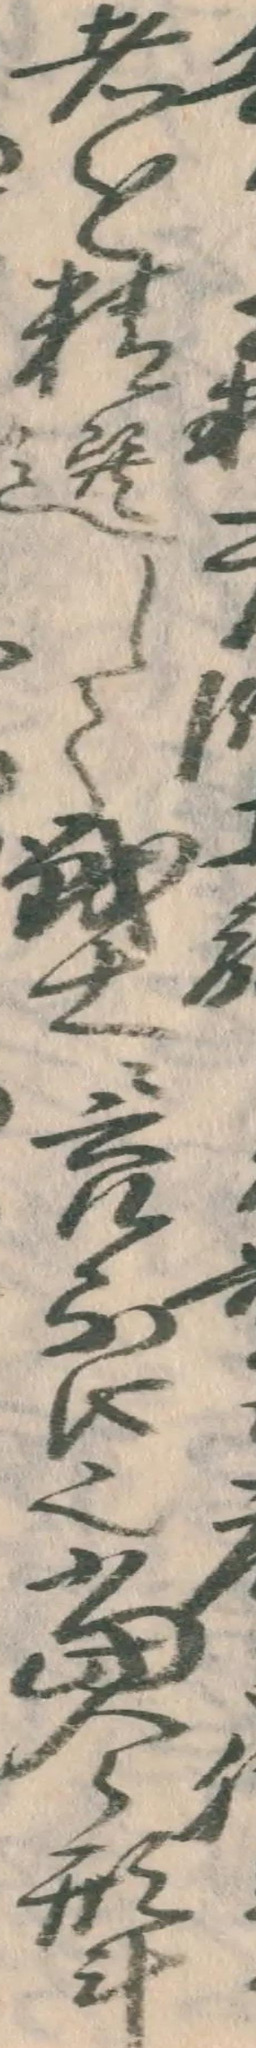者を精選して戦士ニ育る由也當今形斗
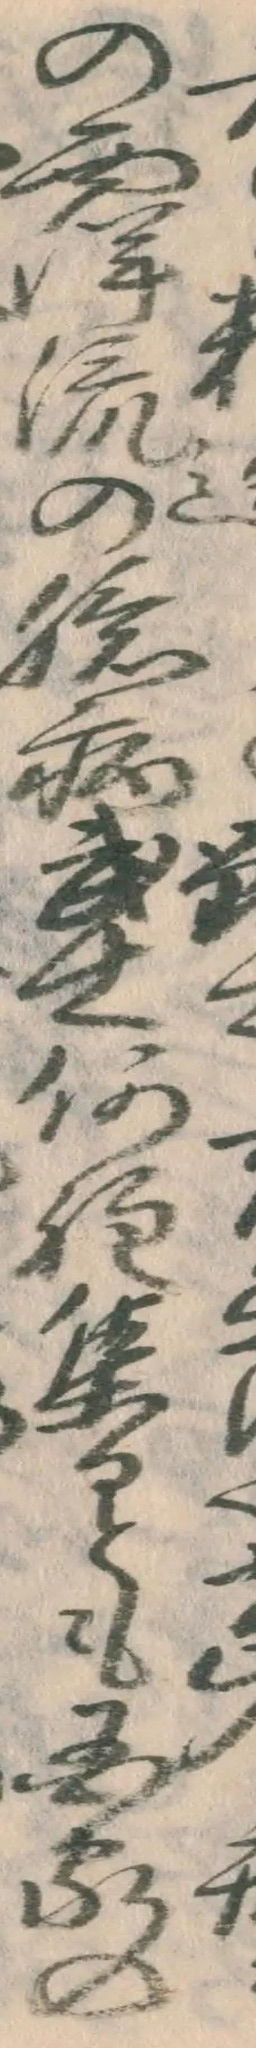の西洋流の臆病武士何程集るとも国家の
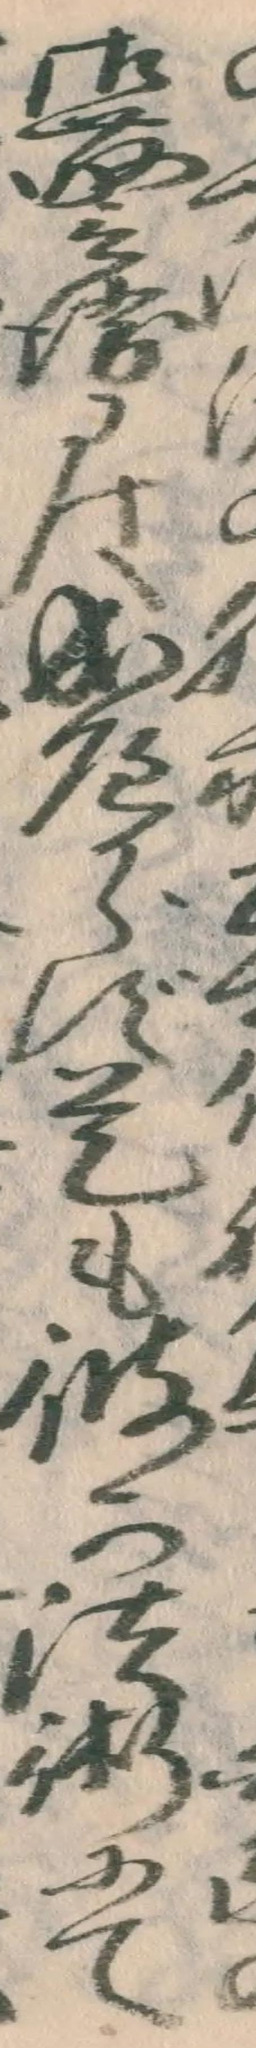御警衛には成へからず是も彼か法術にて
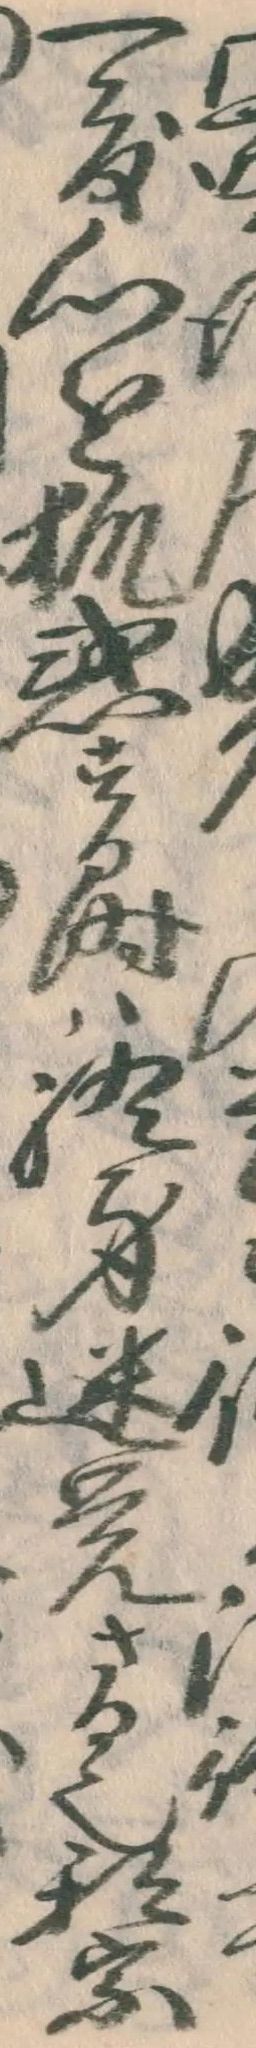一度心を狐惑する時ハ終身迷覚さる也邪宗
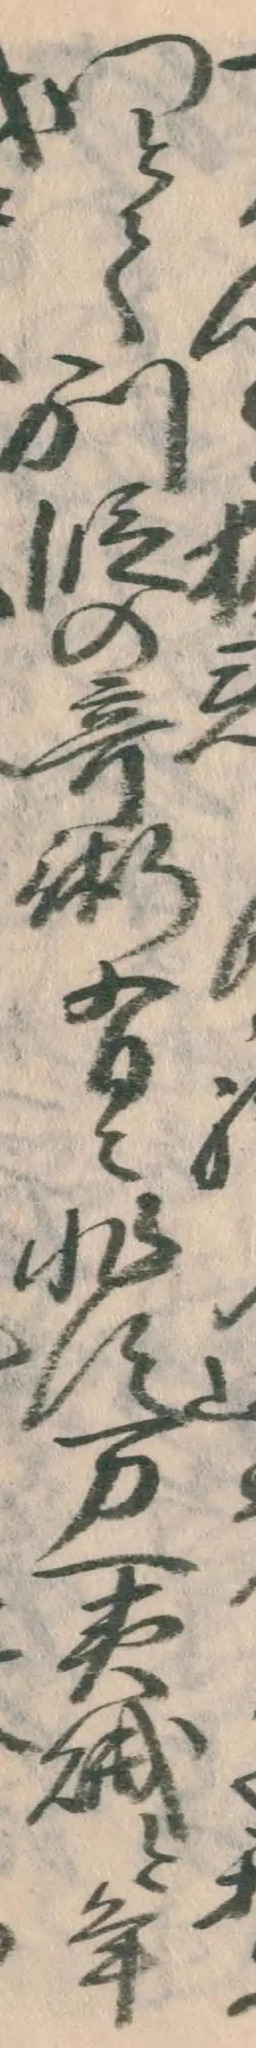門とて別段の奇術有ニ非す万一夷賊と争
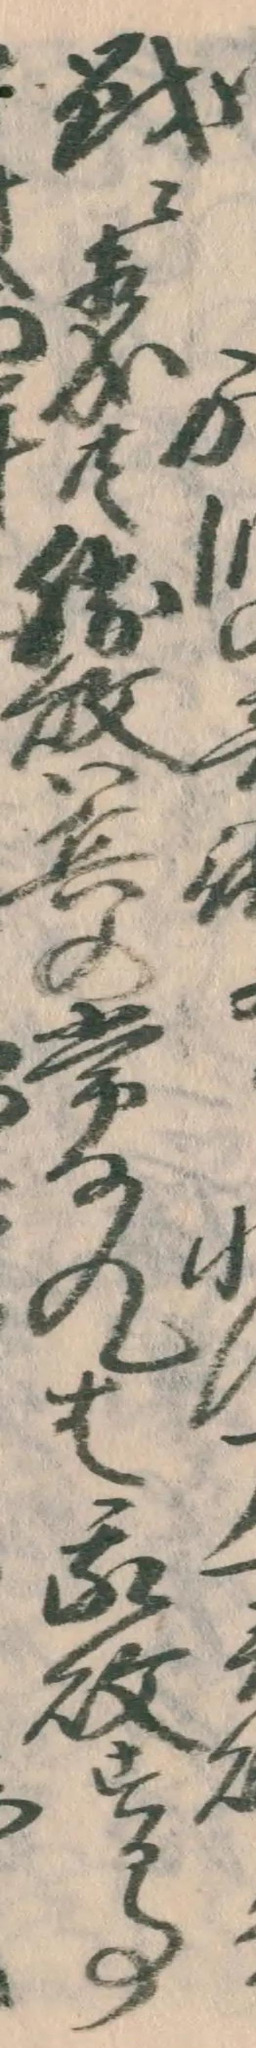戦ニ相成共勝敗ハ兵の常なれは我敗する事
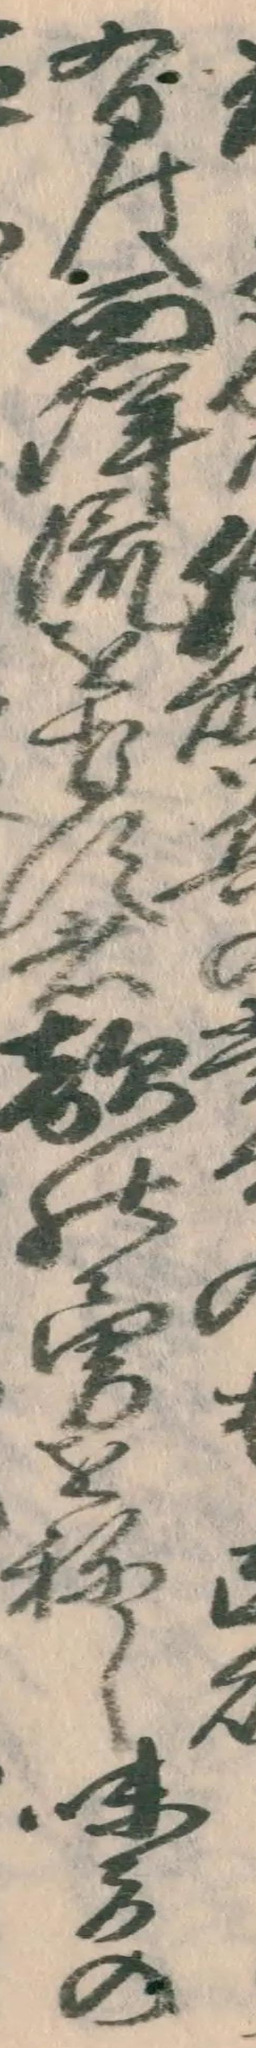有は西洋流をなす者敵の勇を称し味方の
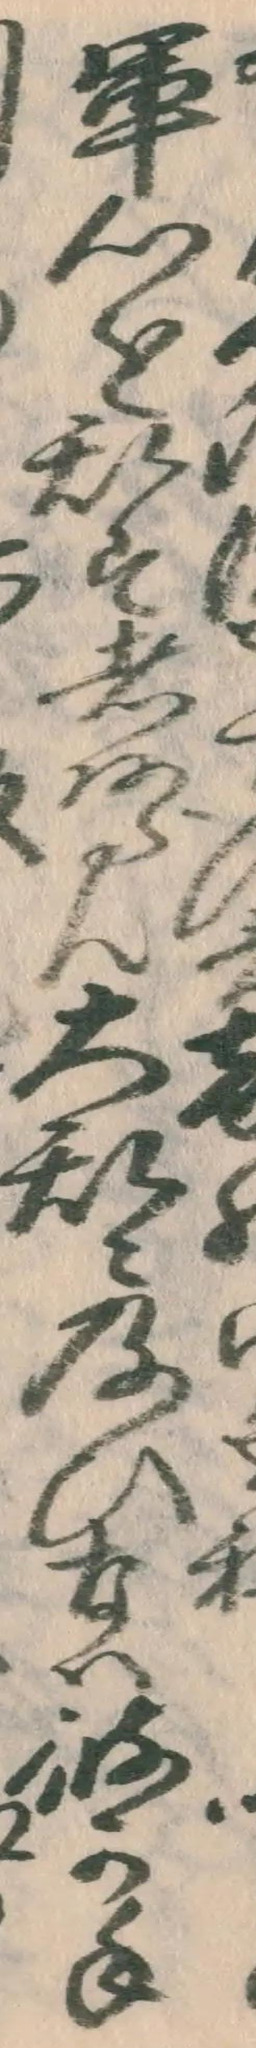軍心を乱す者あらん大乱ニ及ひなハ彼か手
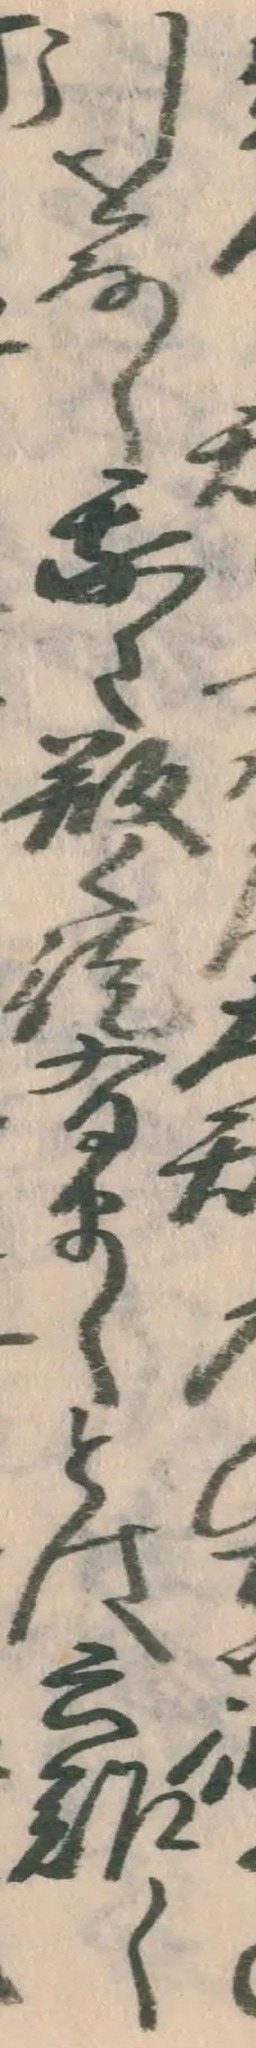引をなし我ニ叛く徒有ましとは云難し
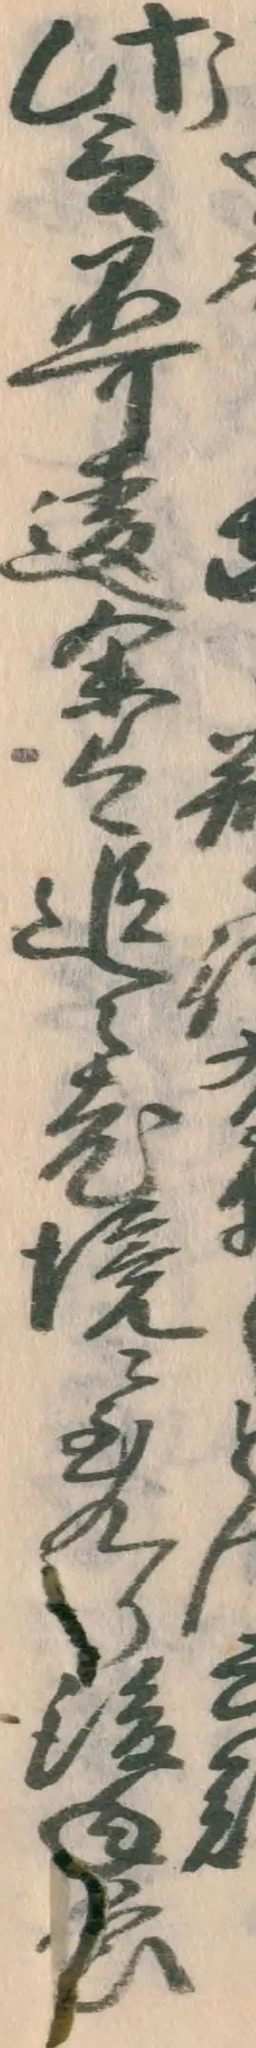此言不可違余今追々老境ニ至れり後年思ひ
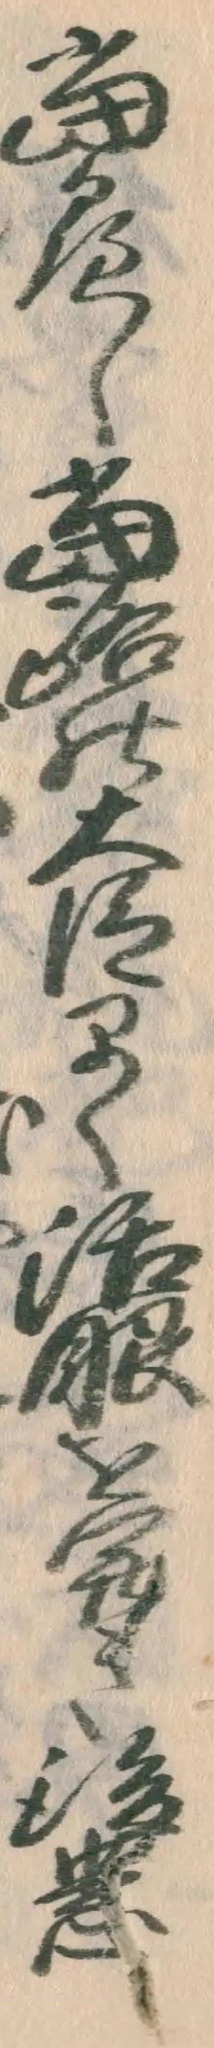當るへし當路の大臣早く活眼を開き後患
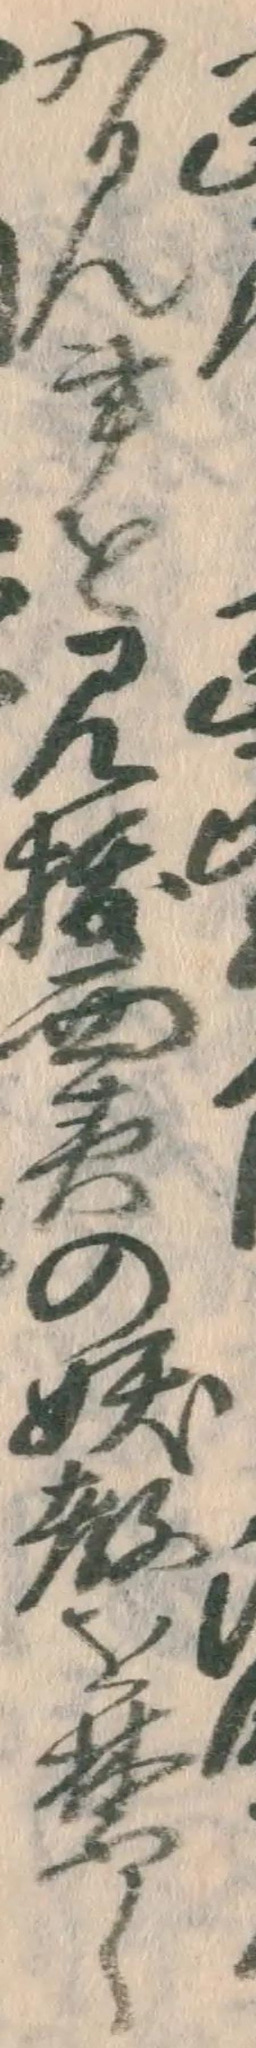有ん事を見抜西夷の妖教を禁し
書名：麗斎叢書. 20
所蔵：国立国会図書館 National Diet Library, JAPAN
